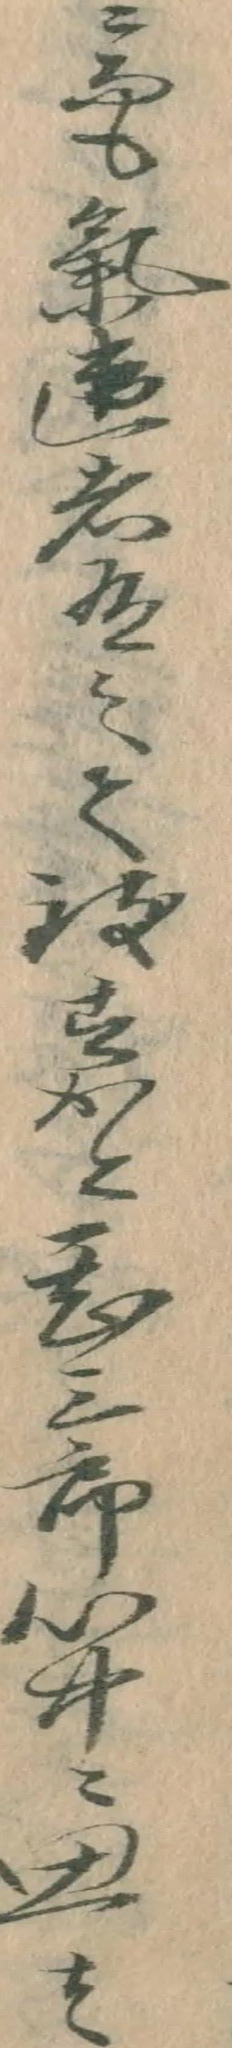に而も気違者有之て致すかと甚三郎心中に思は
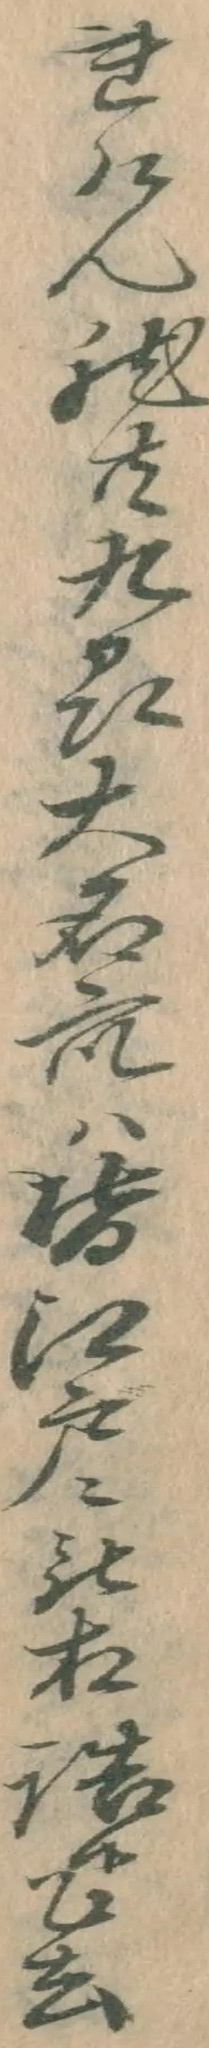れけん然共九州大名衆は皆江戸に被相詰候乍去
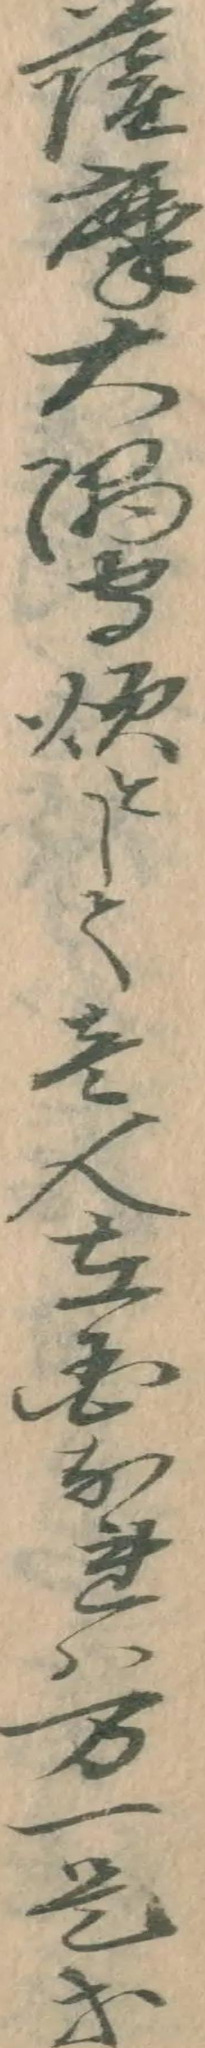薩摩大隅守煩として壱人在国なれは万一是等

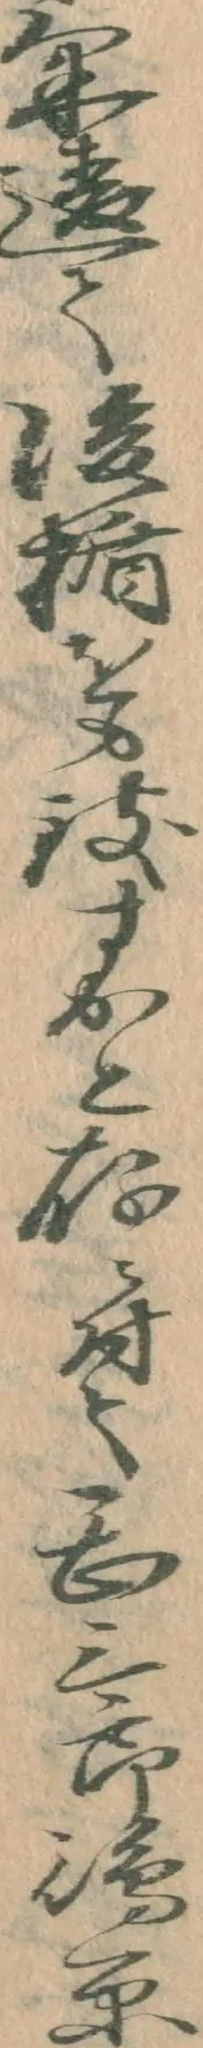気違て後楯をも致すかと存に付て甚三郎島原
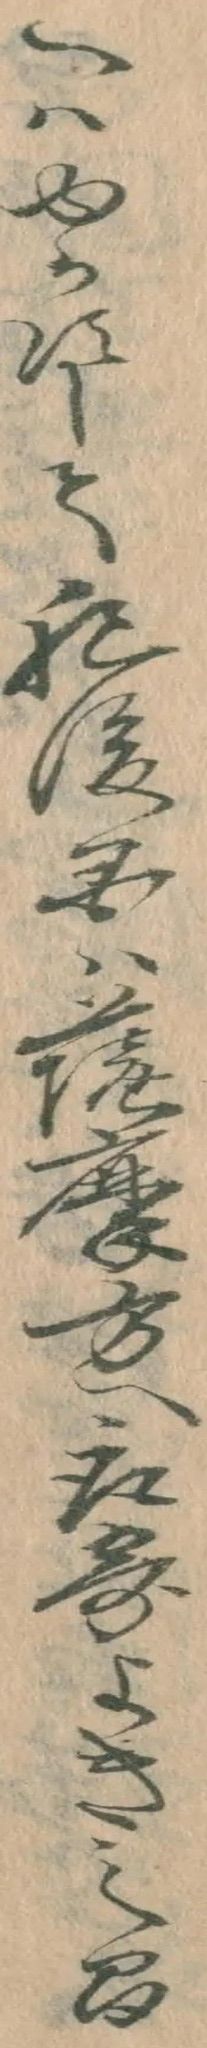へはゆかすして肥後国は薩摩方へ取寄よき之間
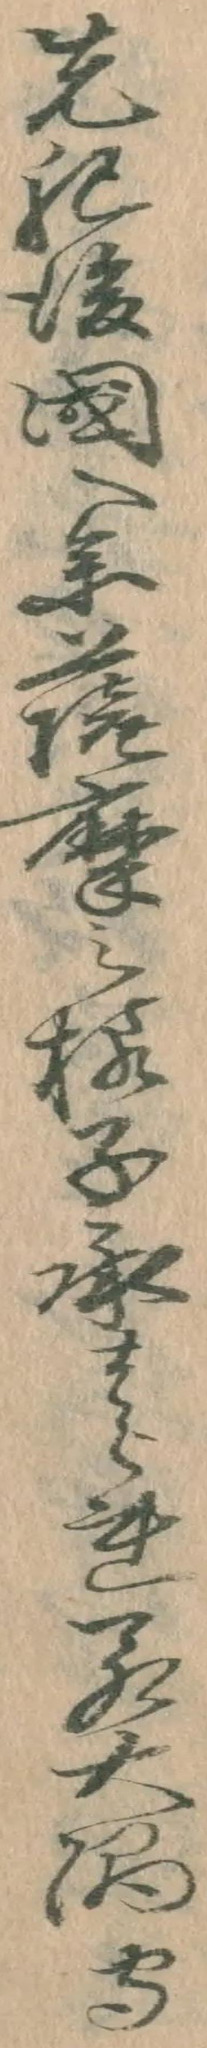先肥後国へ参薩摩之様子承はられ若大隅守
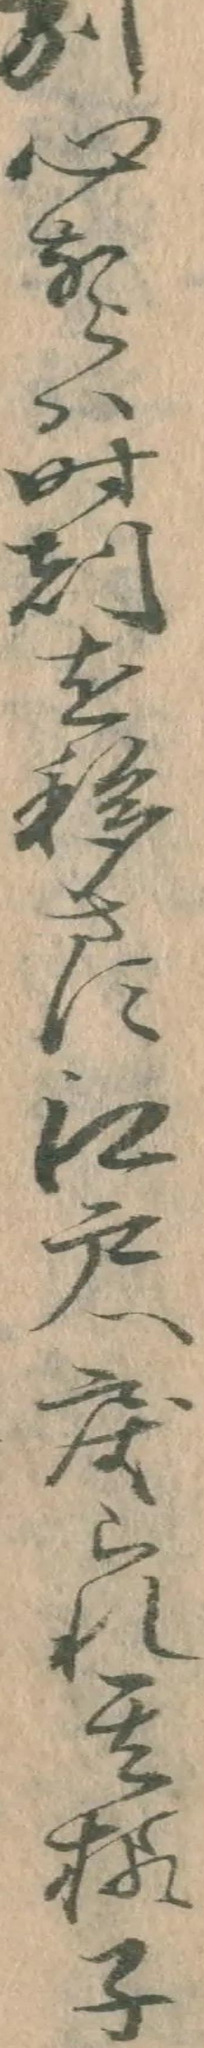別心ならは時刻を移さす江戸へ戻られ其様子
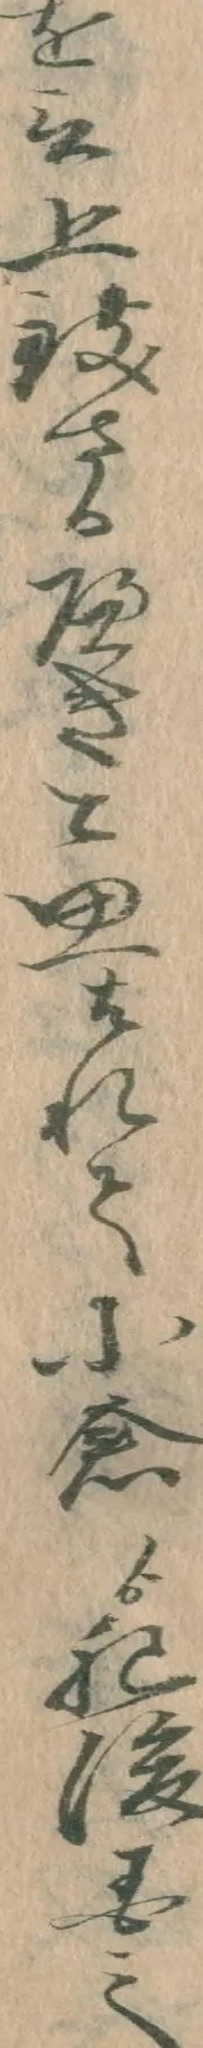を言上致さるへきと思はれて小倉ゟ肥後国之
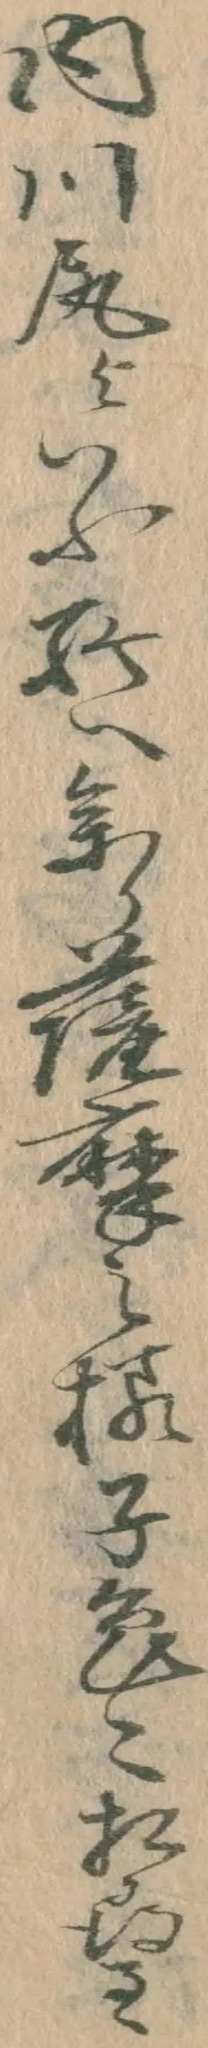内川尻といふ所へ参り薩摩之様子色々相尋るゝ
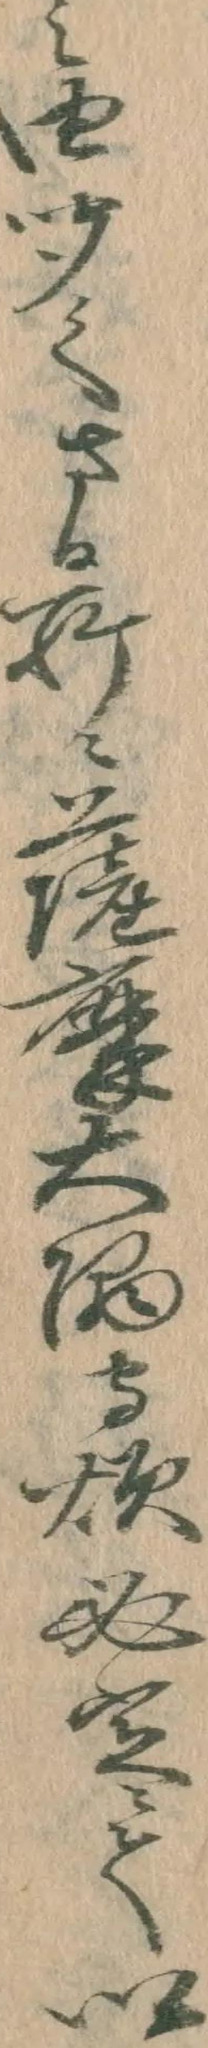之由聞てさる所に薩摩大隅守煩必定にて以
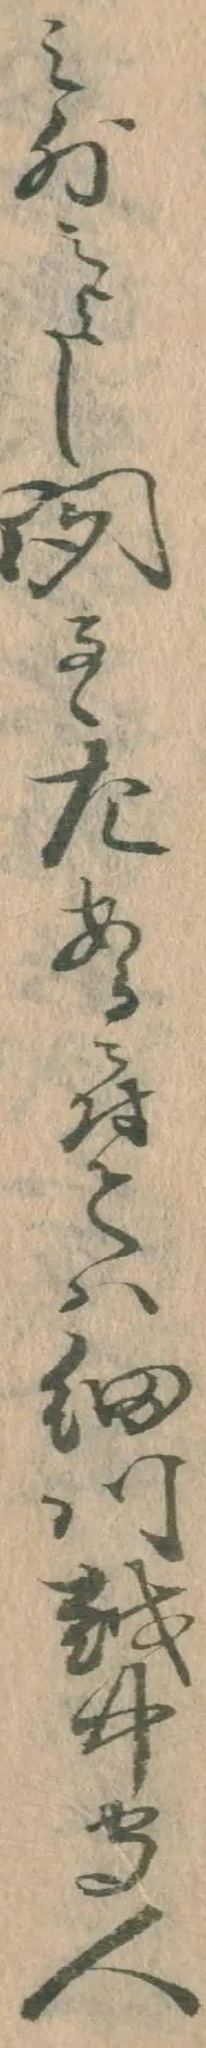之外之よし聞るゝ左あるに付ては細川越中守人
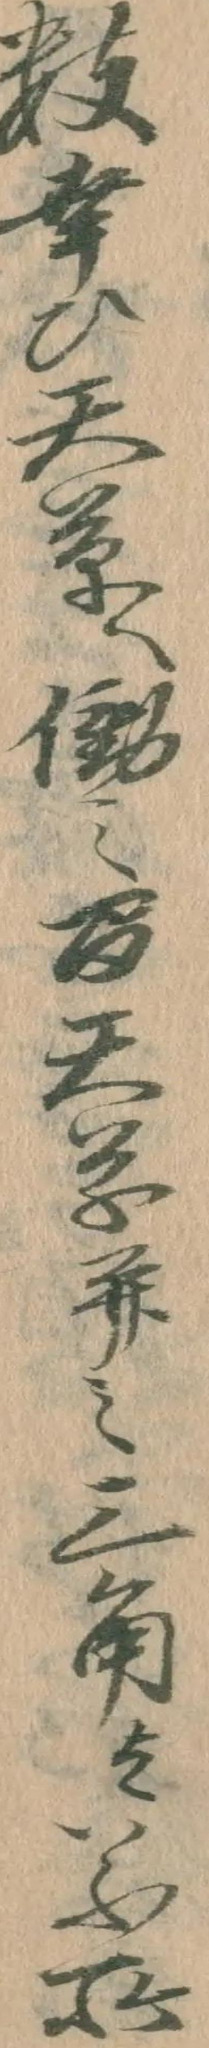数幸ひ天草へ働之間天草并之三角といふ所
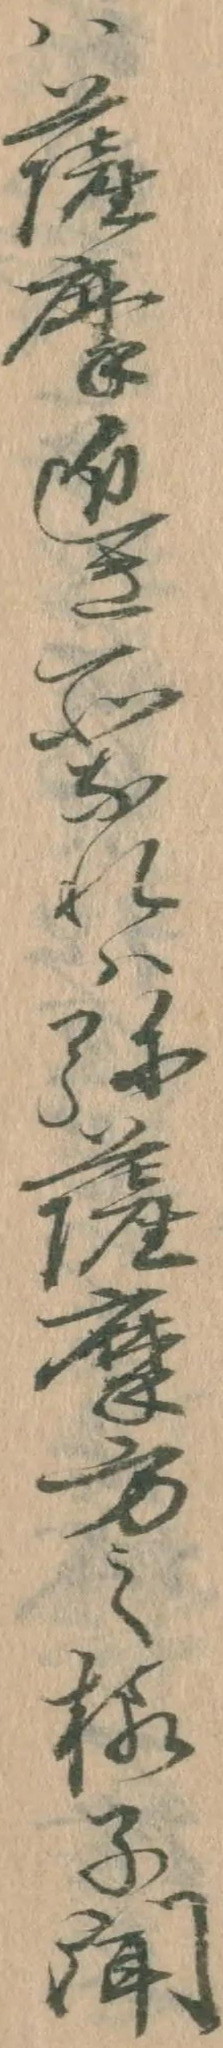は薩摩近き所なれは弥薩摩方之様子聞
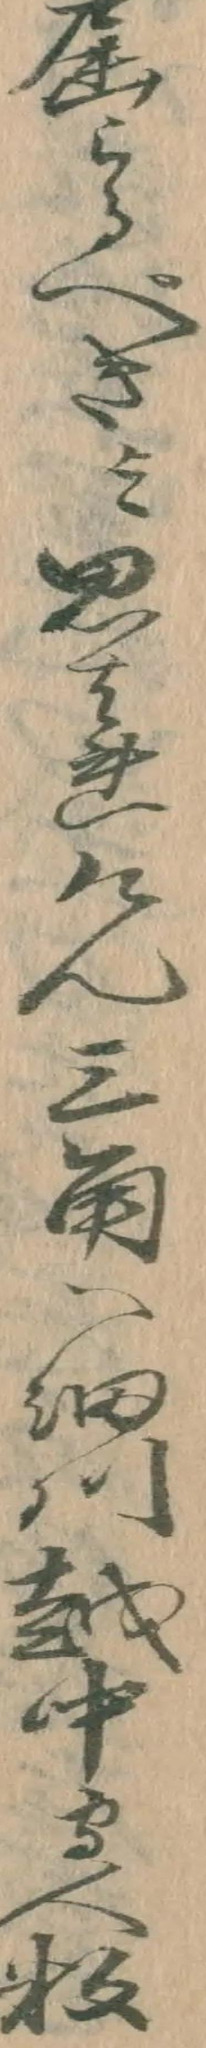届らるべきと思はれけん三角へ細川越中守人数
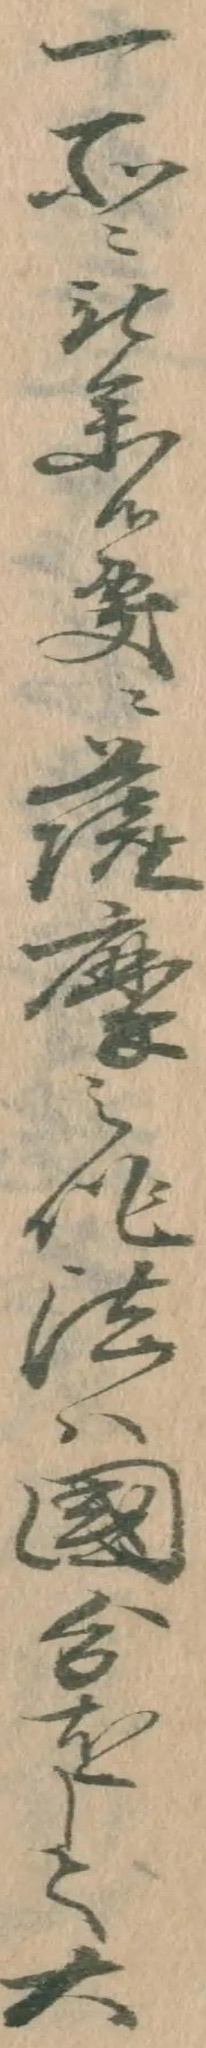一所に被参候処に薩摩之作法は国分をして大
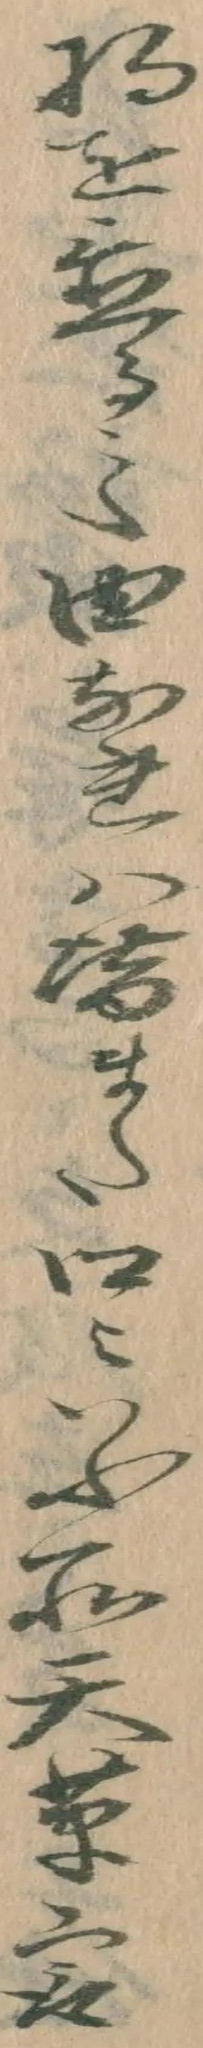将を置る之由なれは皆また口といふ所天草最
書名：切支丹御退治記 49巻. [3]
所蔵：国立国会図書館 National Diet Library, JAPAN
